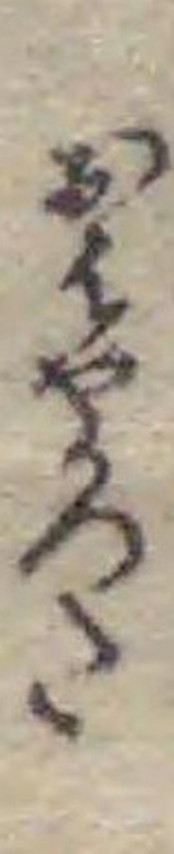おはやかつた
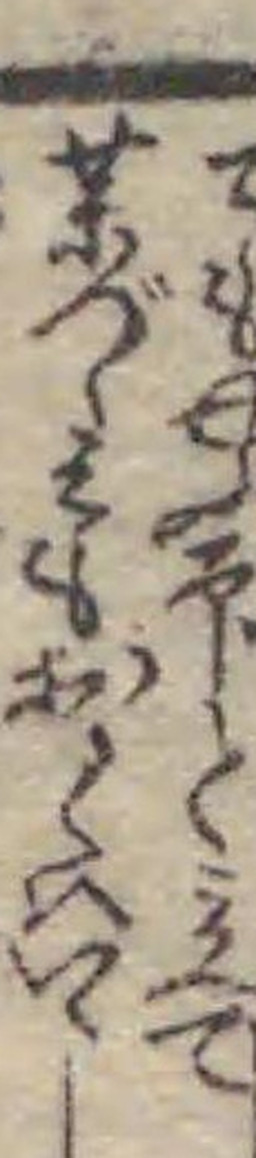薬づゝみもおゝくはいゝ
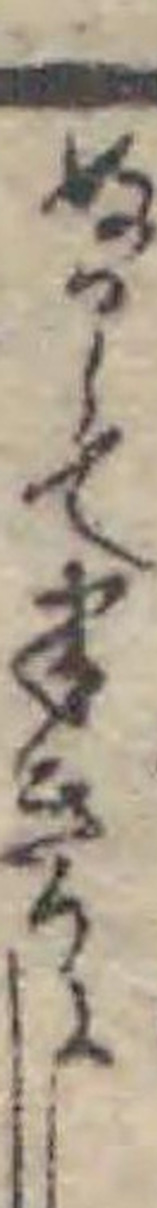ぬかして半きりに
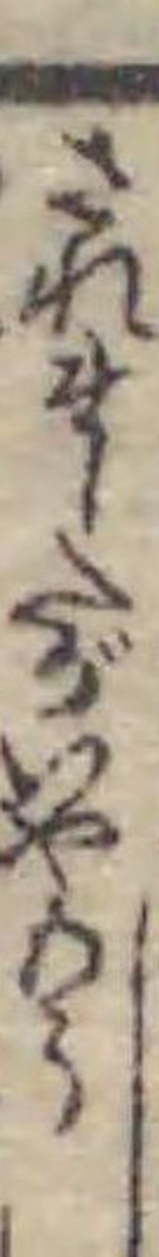されましたがいやもう
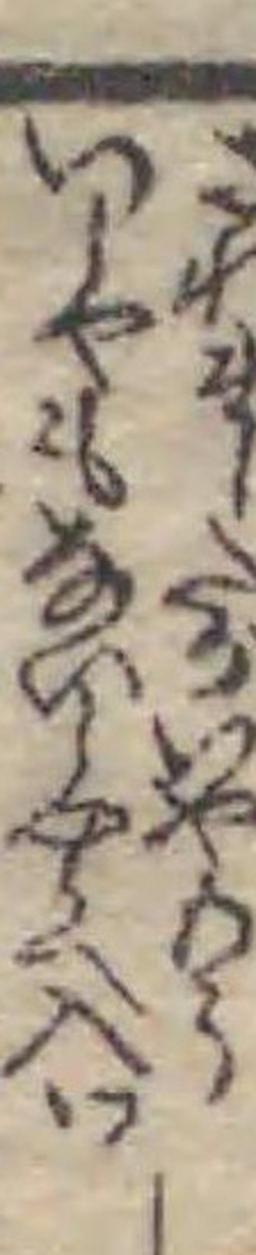いしやもないしやうへ入ツ
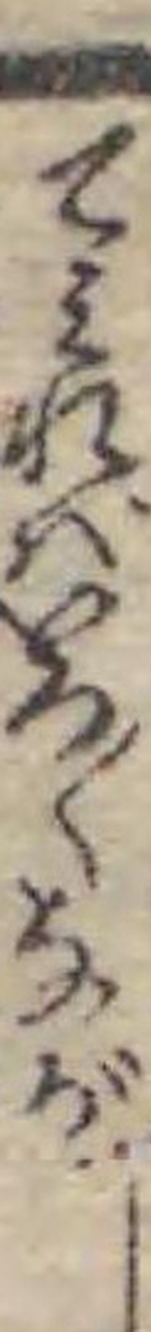てみればいろ〳〵なが
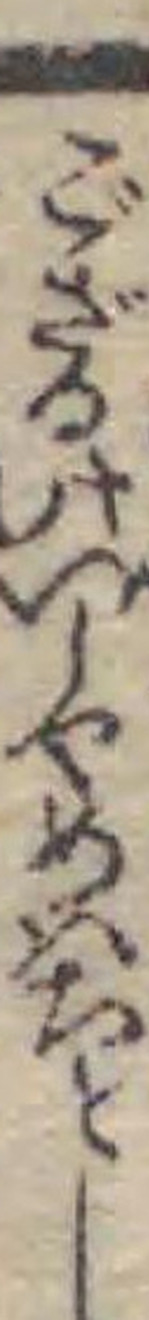ござる此いしやめはちと
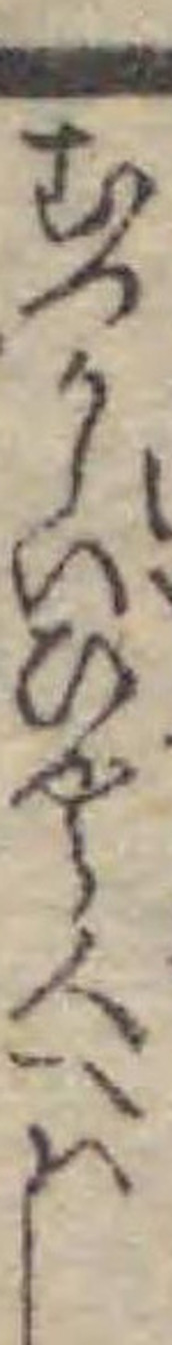むつかしいひやう人へは
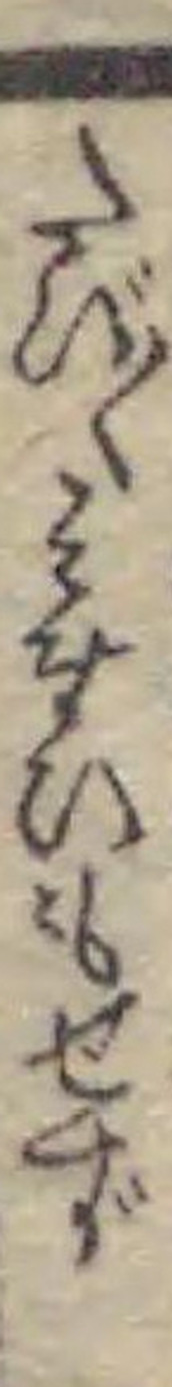たび〳〵みまひもせず
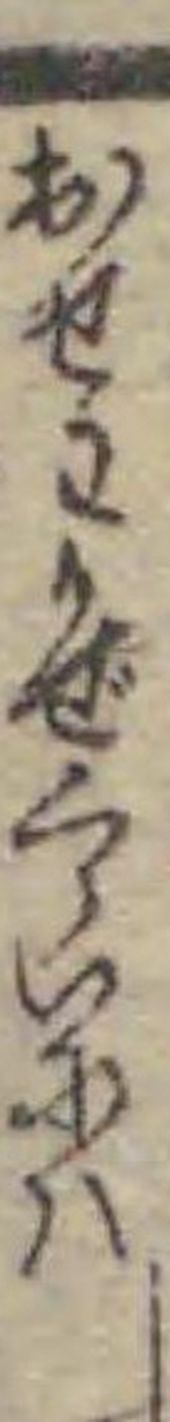おせわかぜくらいには
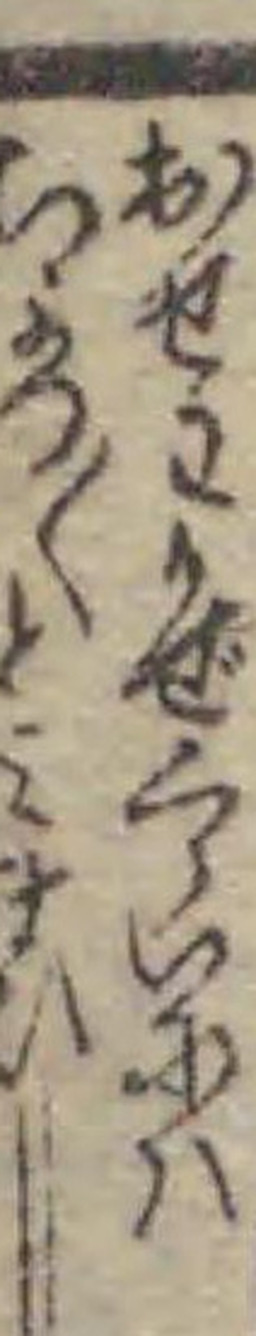ちよつ〳〵とみまひ
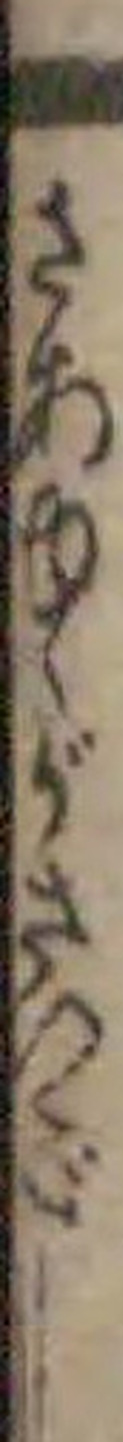さあゆくがさいご
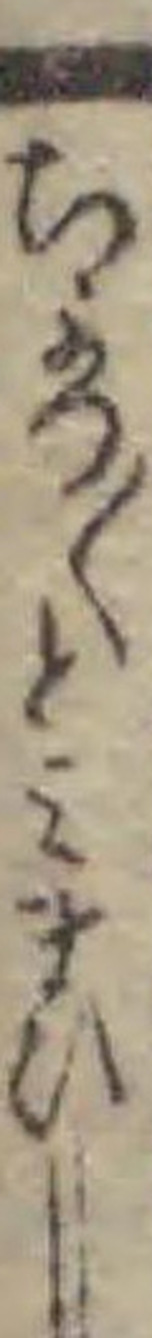ちよつ〳〵とみまひ
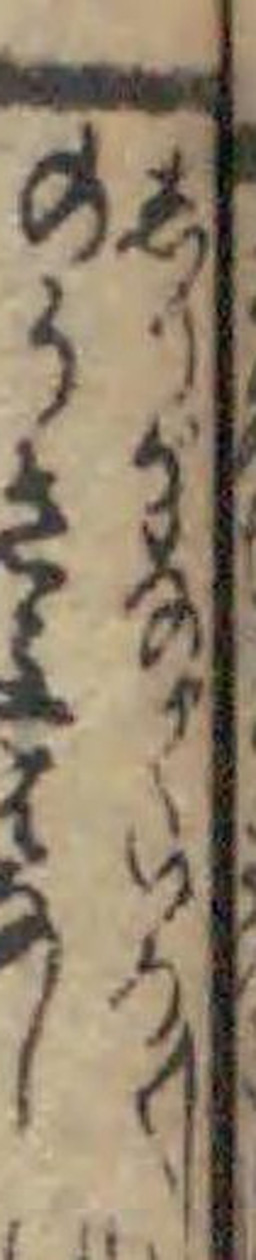のうさよはなし
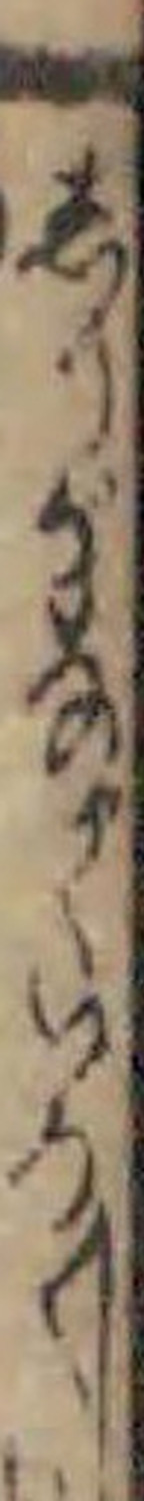しりがなかくいろ〳〵
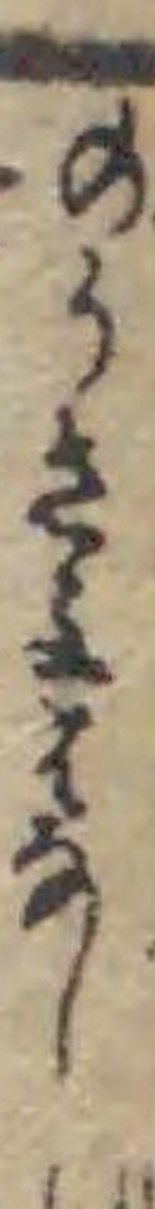のうさよはなし
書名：紙屑身上噺 : 3巻
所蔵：国立国会図書館 National Diet Library, JAPAN
